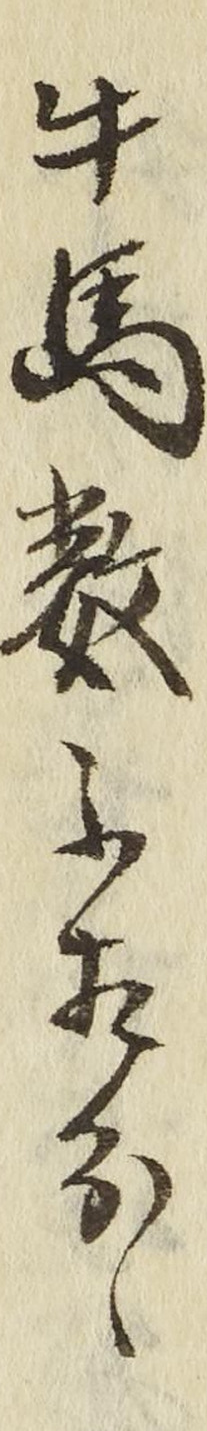牛馬数不相分候
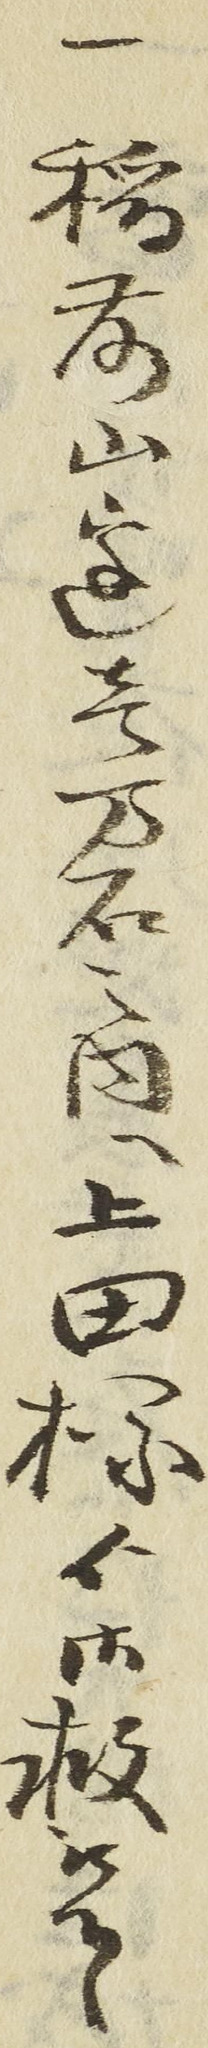一稲荷山辺壱万石之内へ上田様ゟ御救被下候
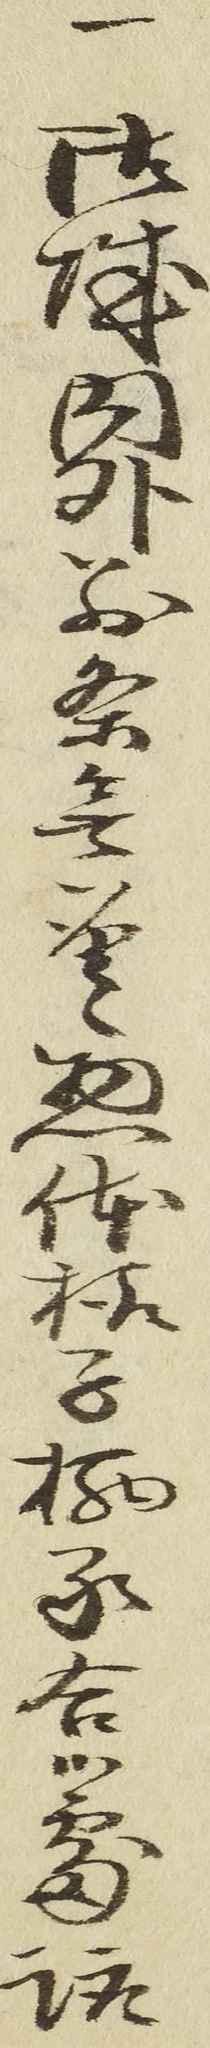一御城内外別条無御座候惣体様子柄承合候処諏
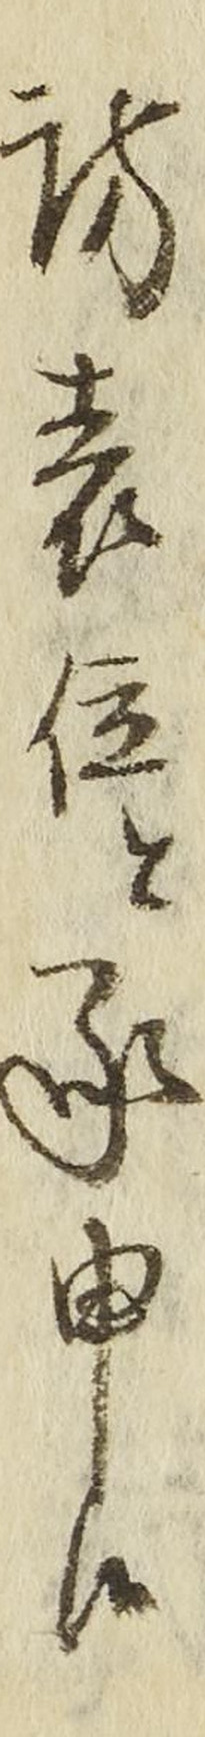訪表位と承申候
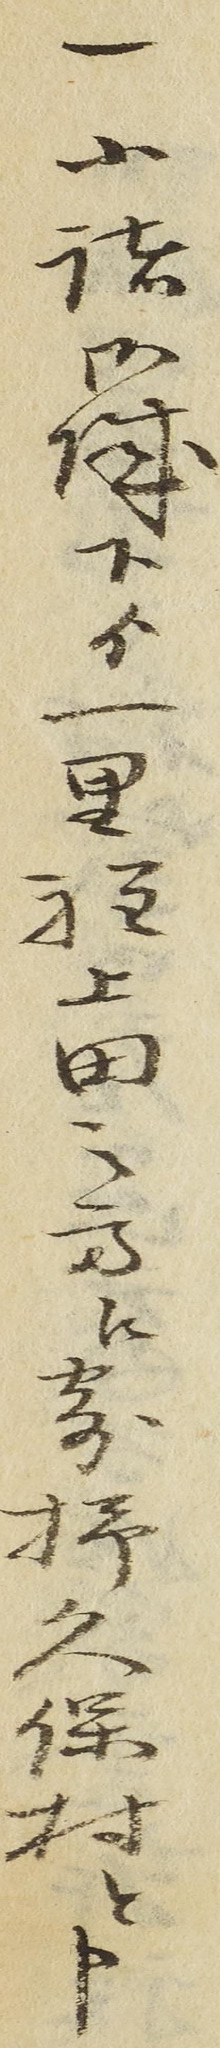一小諸御城下ゟ一里程上田之方江寄抒久保村と申

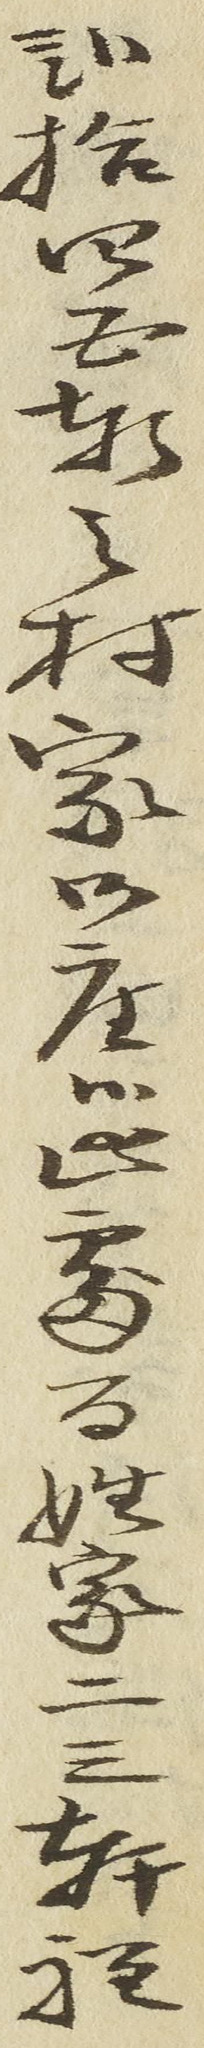弐拾四五軒之村家御座候此処百姓家二三軒程
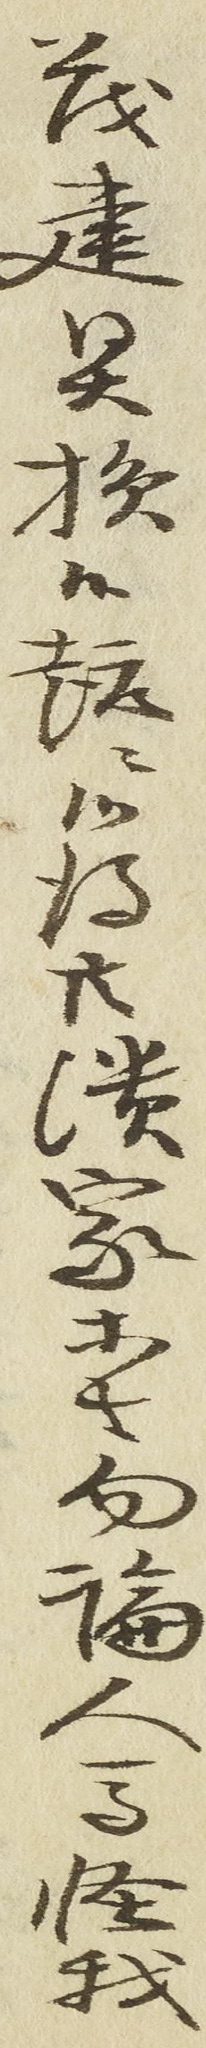も建具損候趣二候得共潰家等は勿論人馬怪我
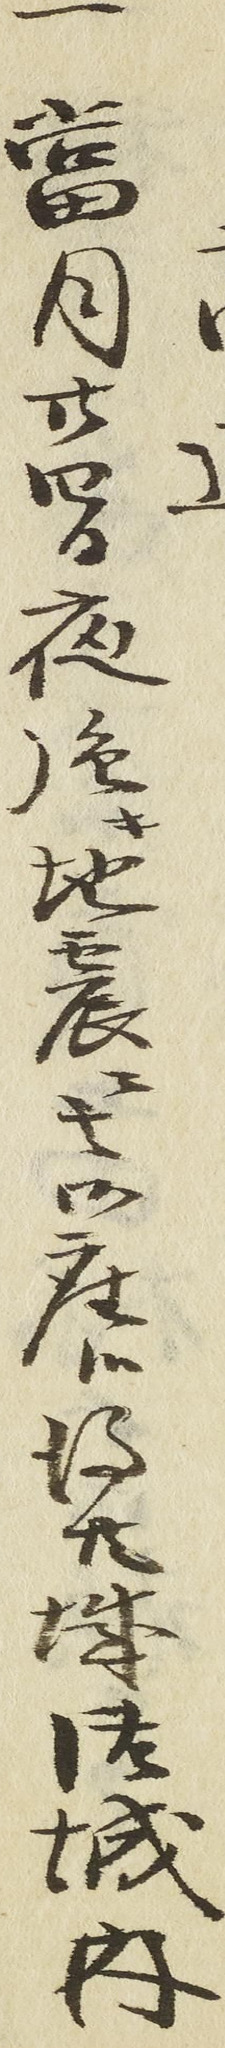一当月廿四日夜強キ地震二は御座候得共城御城内
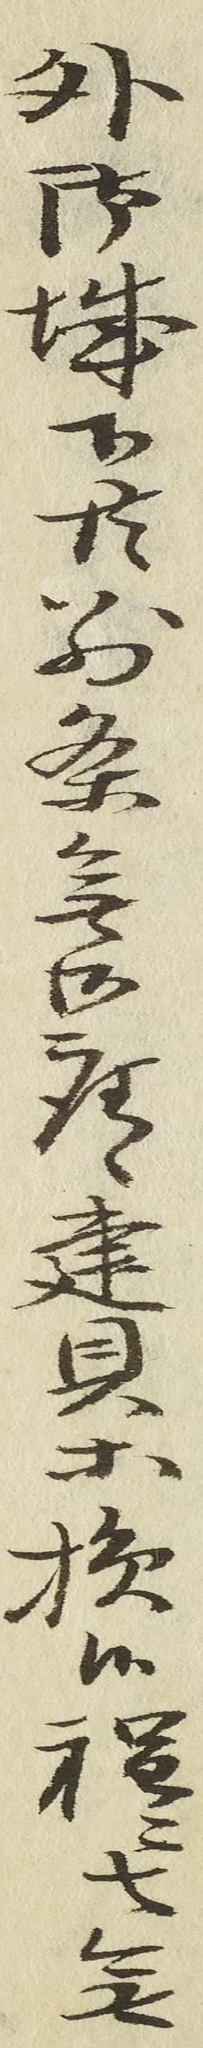外御城下共別条無御座候建具等損候程二は無
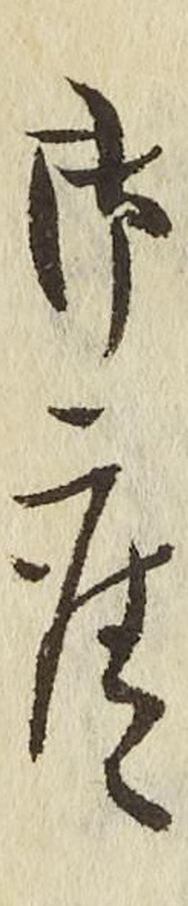御座候
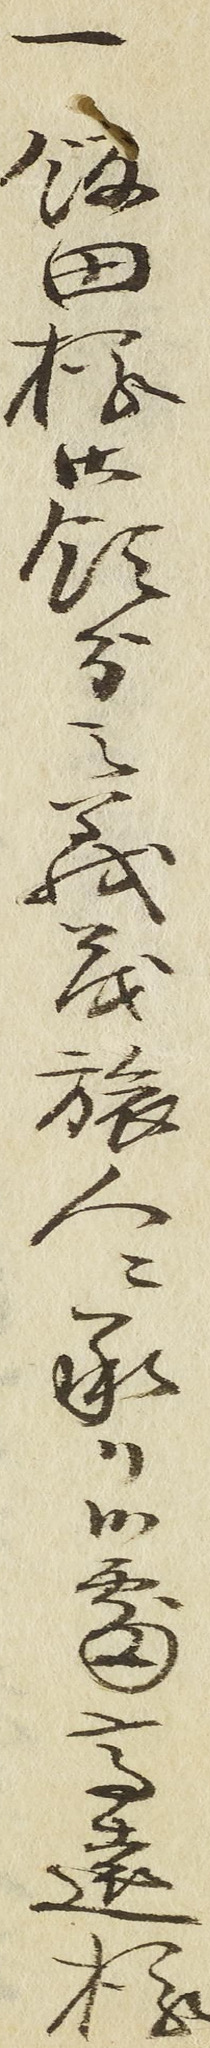一飯田様御領分之義も旅人二承り候処高遠様
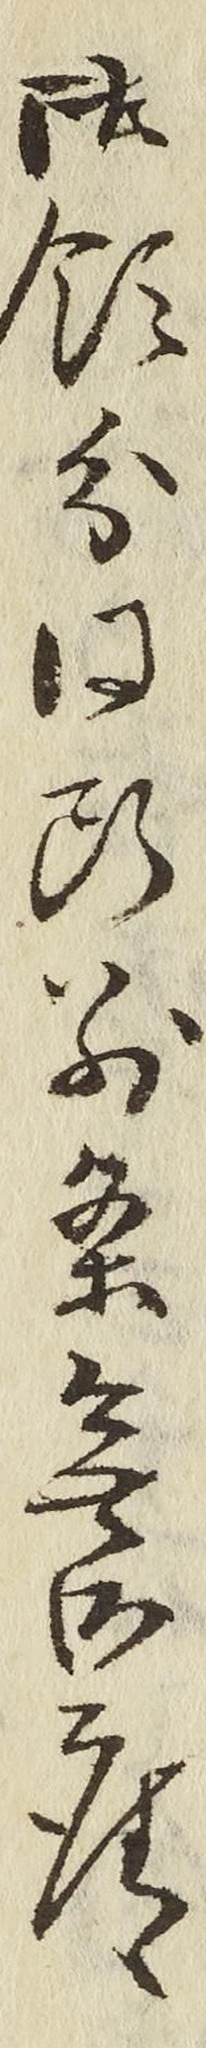御領分同断別条無御座候
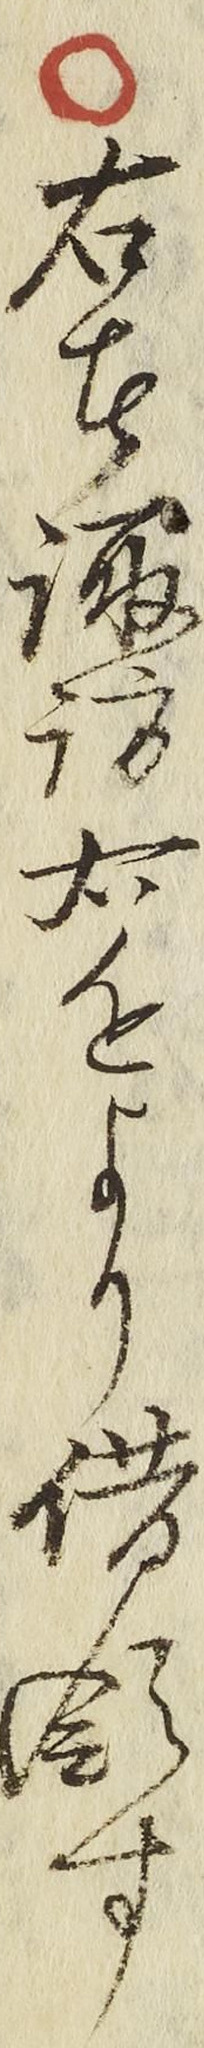○右は諏訪右近より借領す
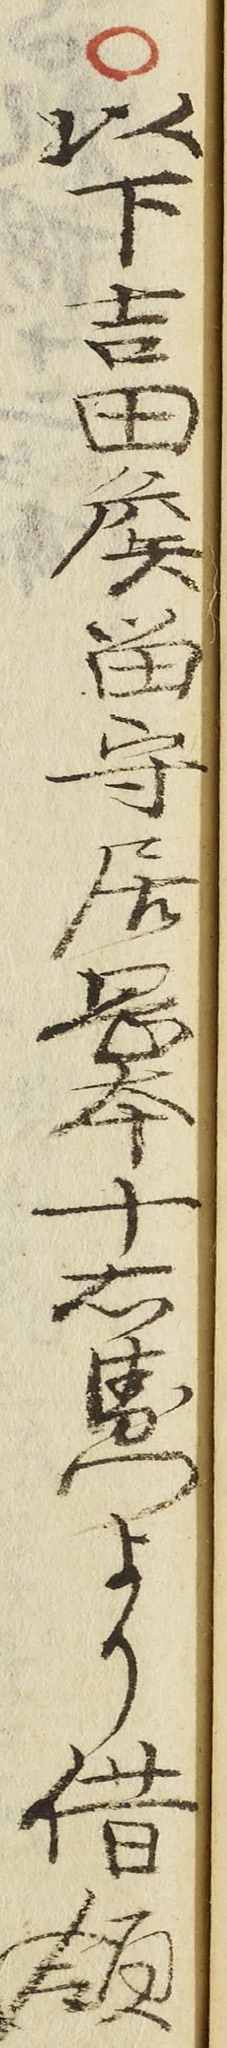○以下吉田矦留守居岡本十右衛門より借領
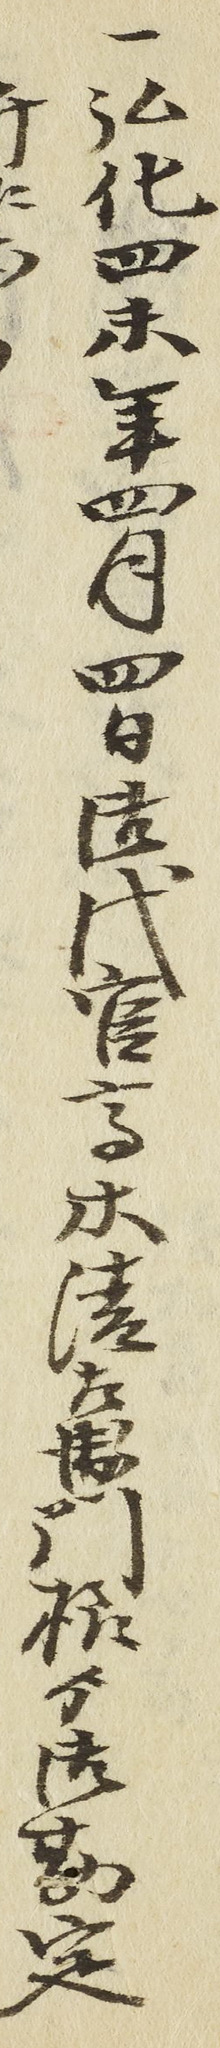一弘化四未年四月四日御代官高木清左衛門様ゟ御勘定
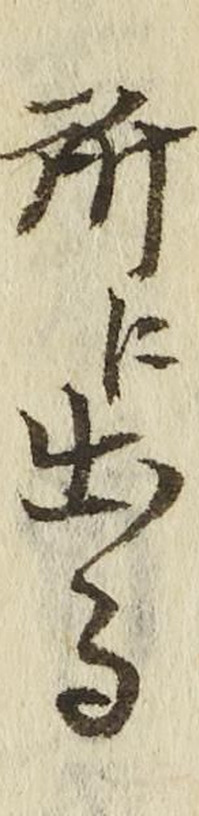所江出る
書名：信濃國大地震記　乾
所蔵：東京大学地震研究所図書室 Earthquake Research Institute Library, The University of Tokyo, JAPAN
